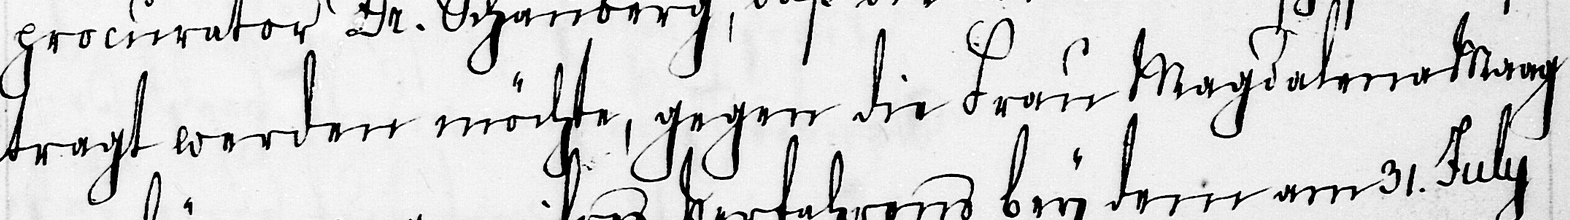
tragt werden möchte, gegen die Frau Magdalena Maag
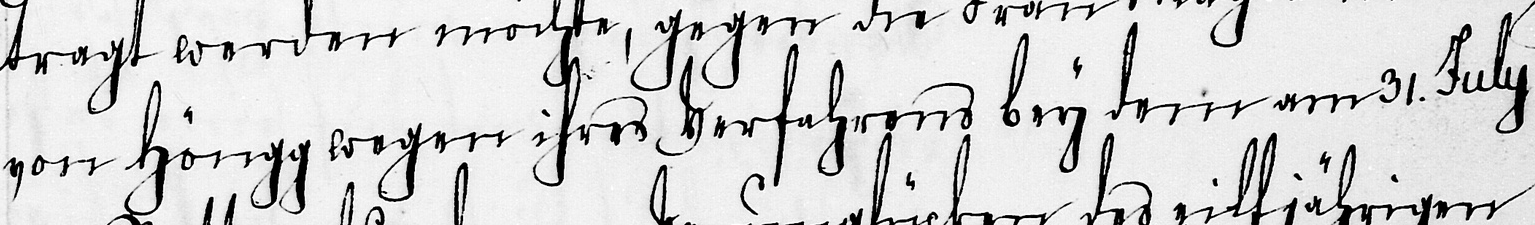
von Höngg wegen ihres Verfahrens bey dem am 31. July
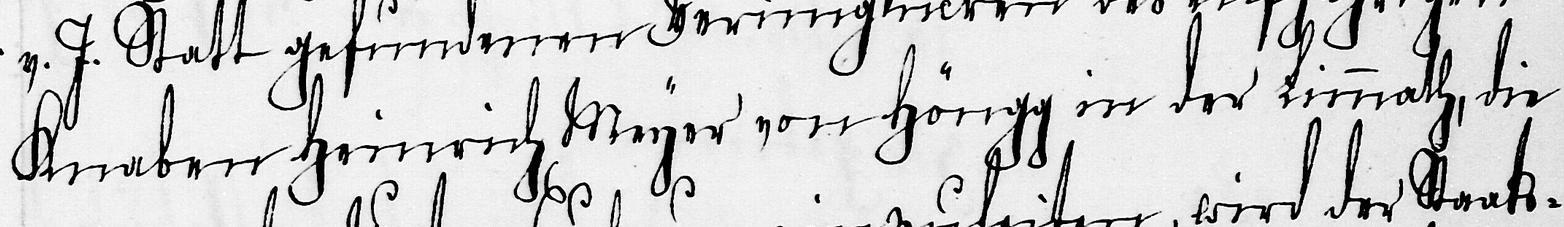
Knaben Heinrich Meyer von Höngg in der Limmath, die
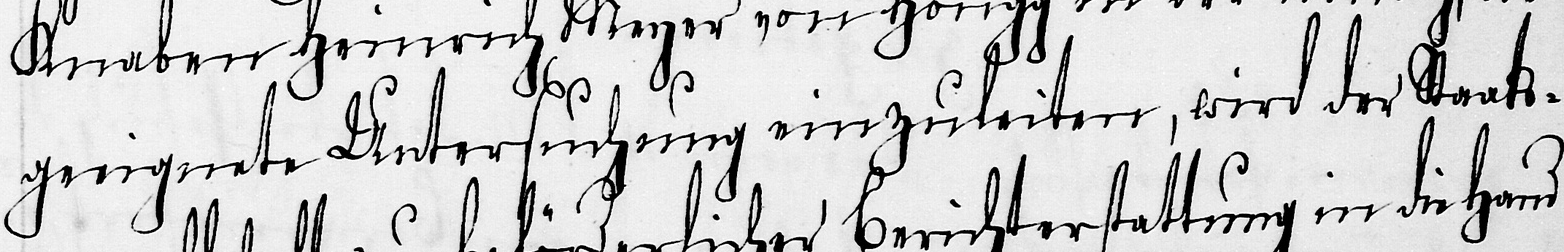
geeignete Untersuchung einzuleiten, wird der Staats¬
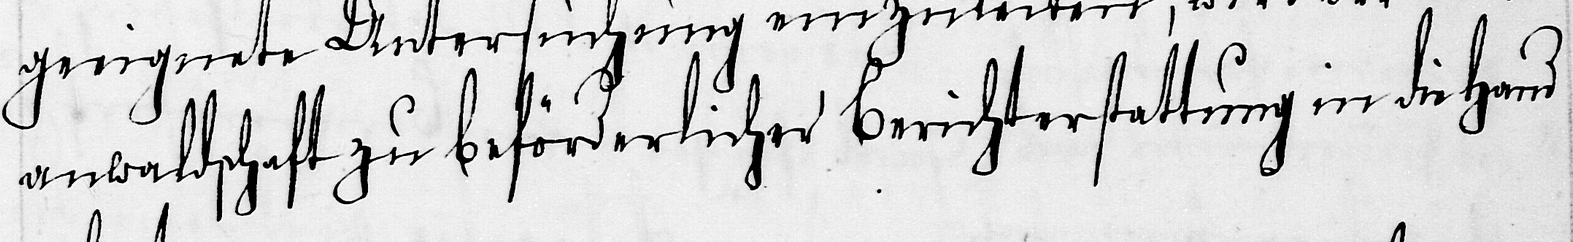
anwaldschaft zu beförderlicher Berichtserstattung in die
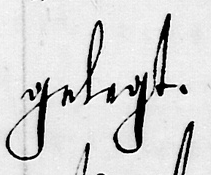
gelegt.
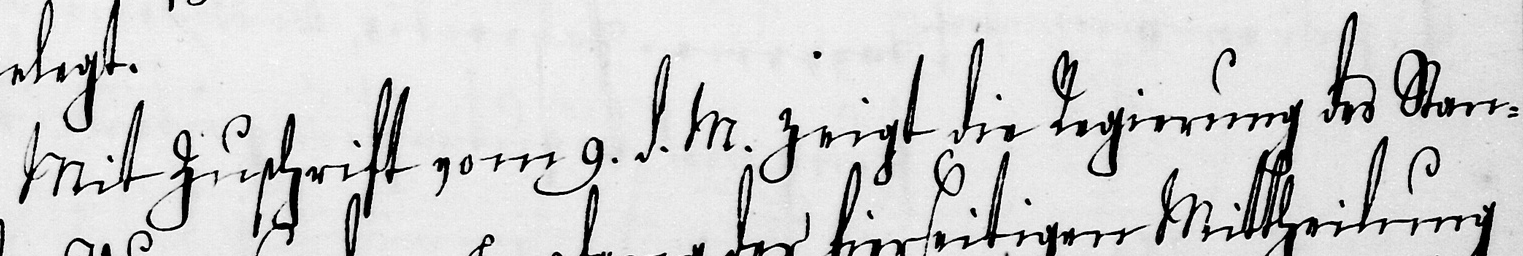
Mit Zurschrift vom 9. d. M. zeigt die Regierung des Stan¬
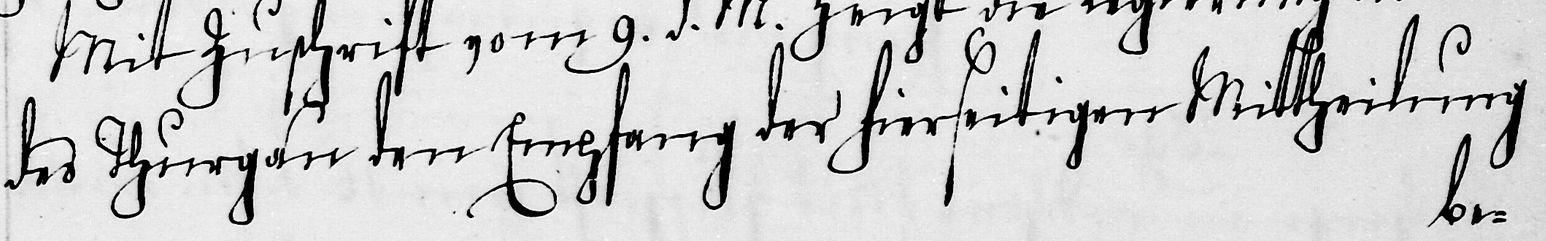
des Thurgau den Empfang der hierseitigen Mittheilung
